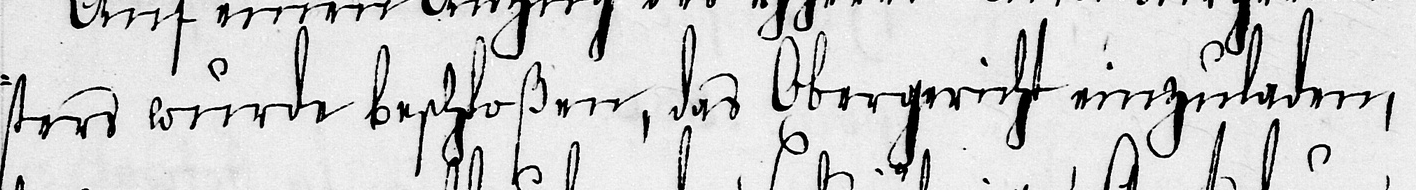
ters wurde beschloßen, das Obergericht einzuladen,
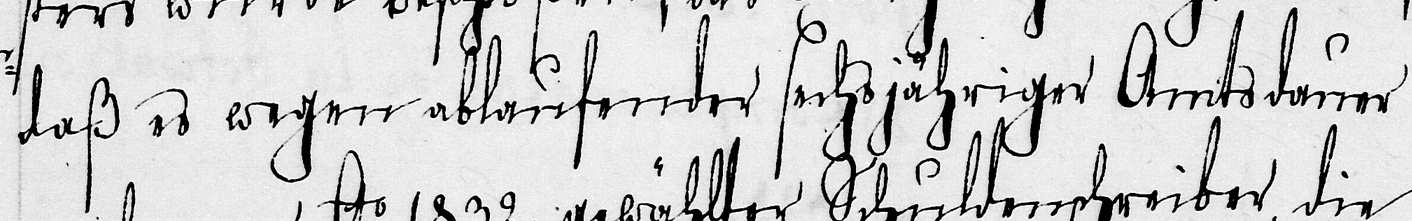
daß es wegen ablaufender sechsjähriger Amtsdauer
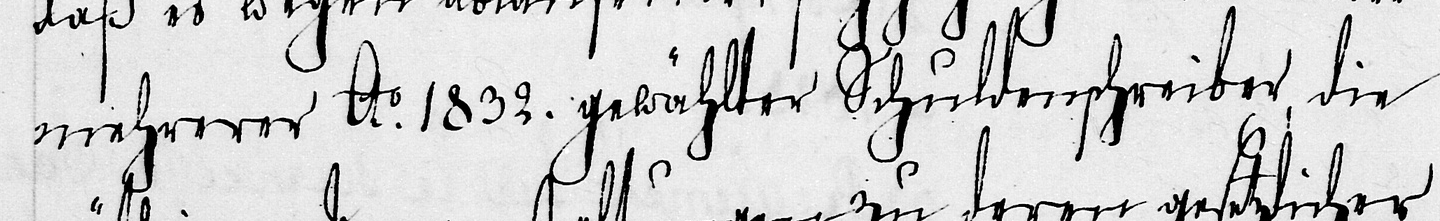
mehrerer Ao. 1832. gewählter Schuldenschreiber, die
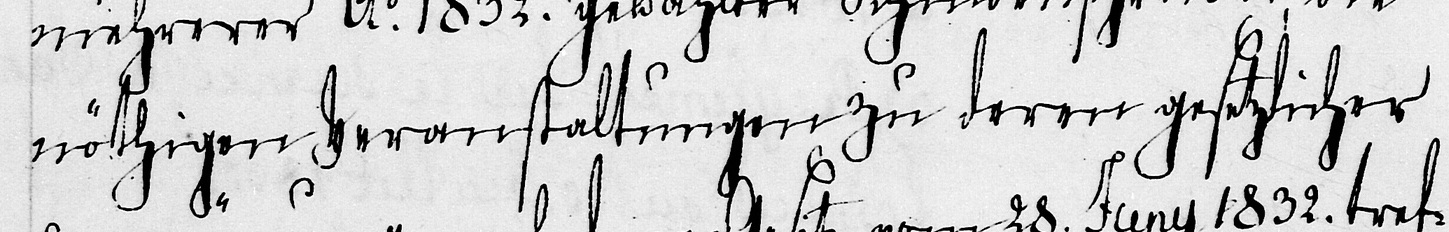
nöthigen Veranstaltungen zu deren gesetzlicher
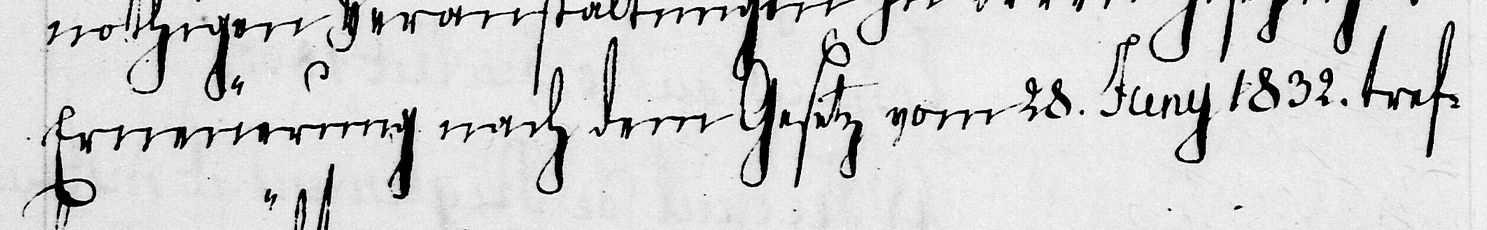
Erneuerung nach dem Gesetz vom 28. Juny 1832. tref¬
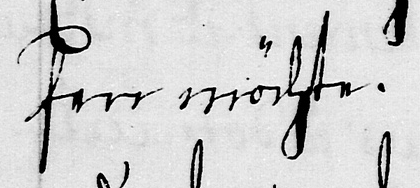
fen möchte.
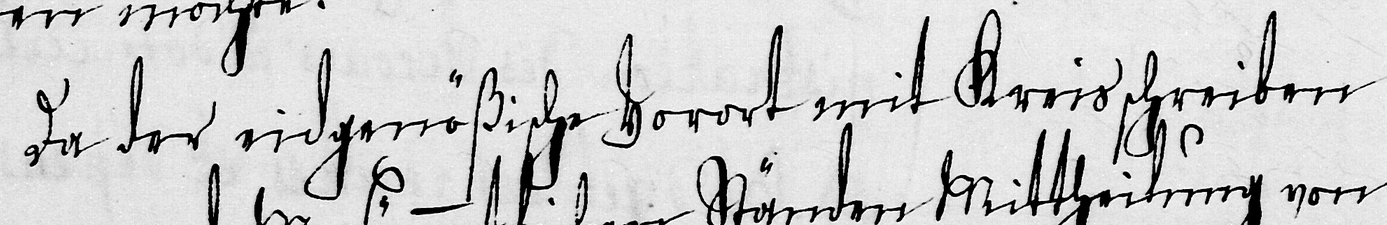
Da der eidgenößische Vorort mit Kreisschreiben
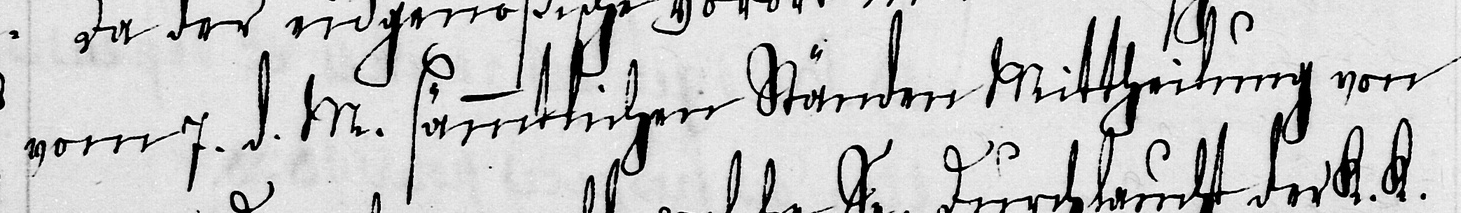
vom 7. d. M. sämmtlichen Ständen Mittheilung von
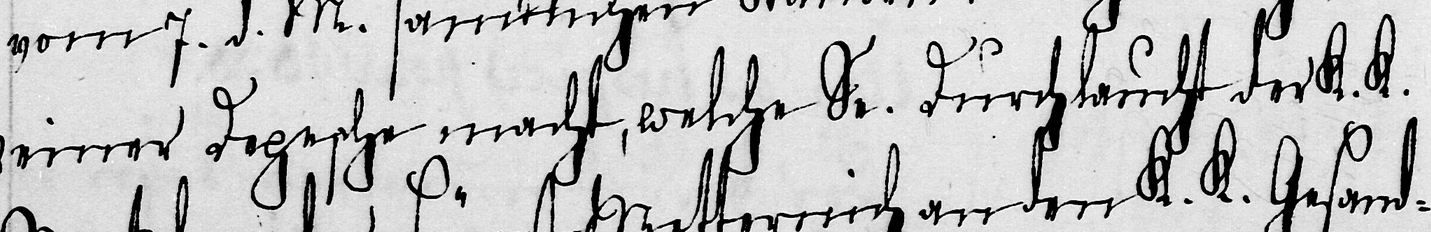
einer Depesche macht, welche Se. Durchlaucht der K. K.
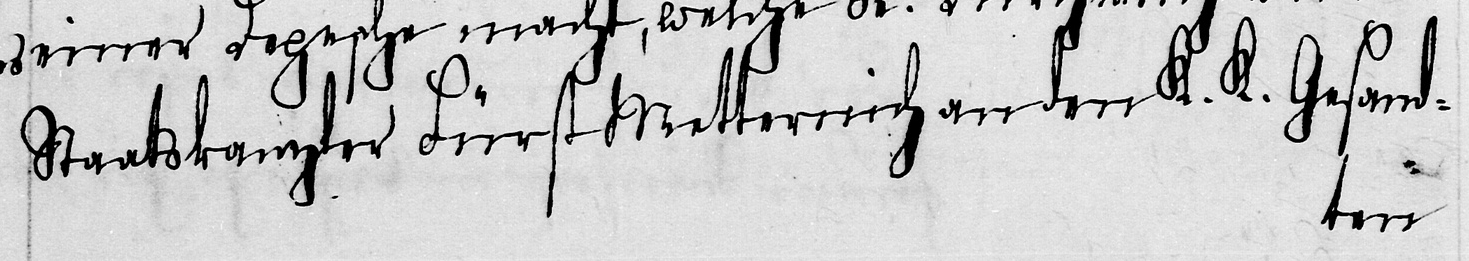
Staatskanzler Fürst Metternich an den K. K. Gesand-
